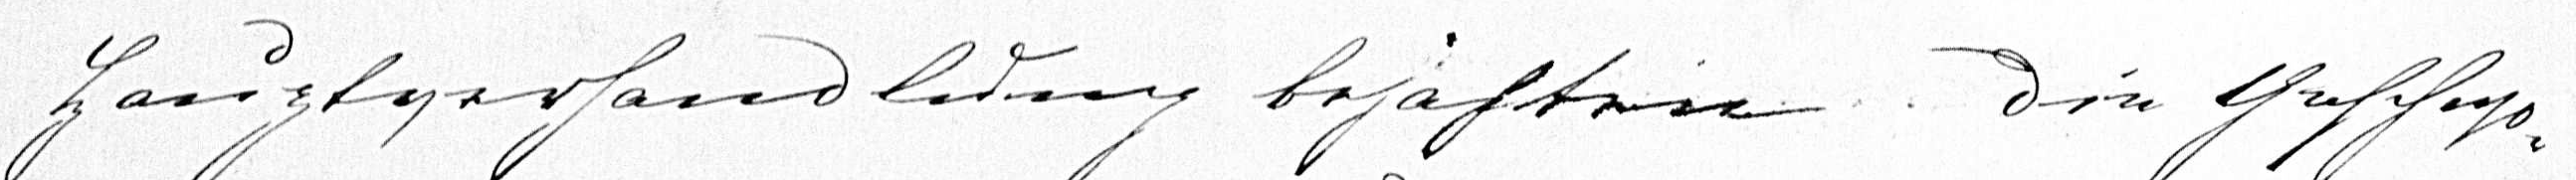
Hauptverhandlung bejahten. Die Geschwo¬
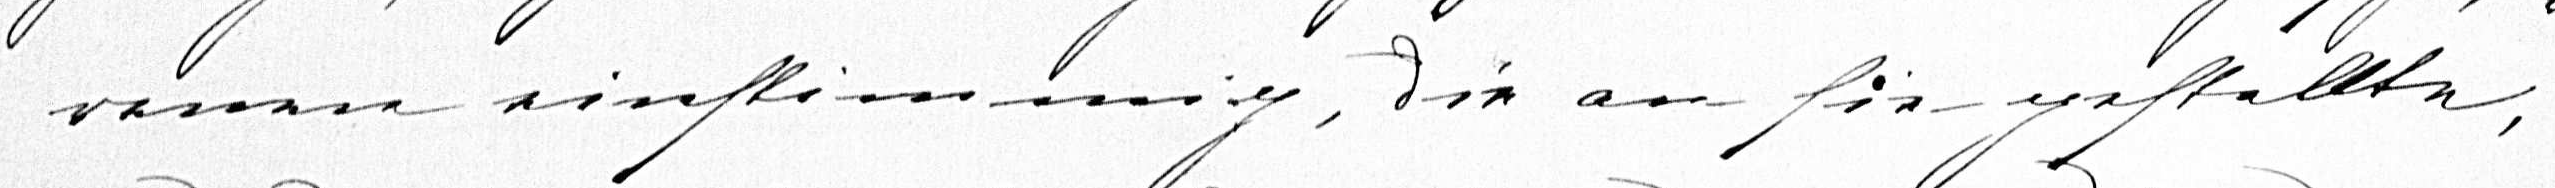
renen einstimmig, die an sie gestellte
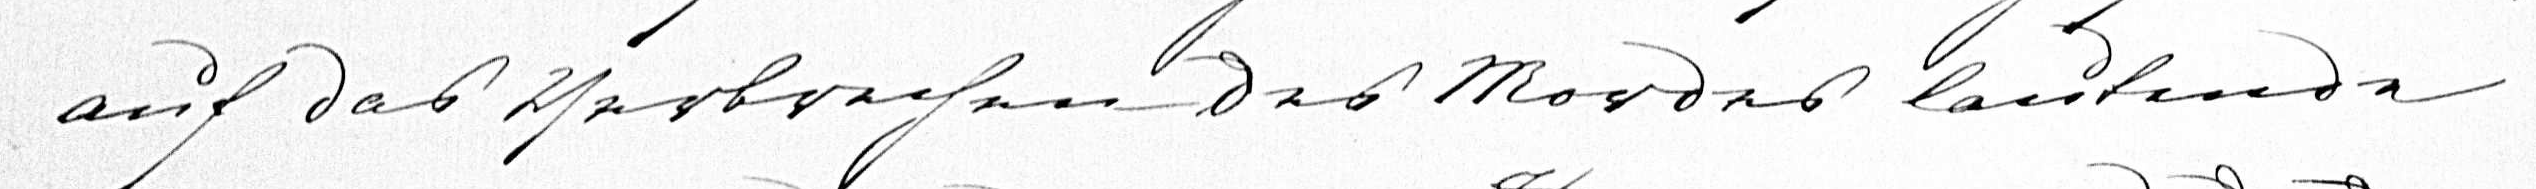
auf das Verbrechen des Mordes lautende
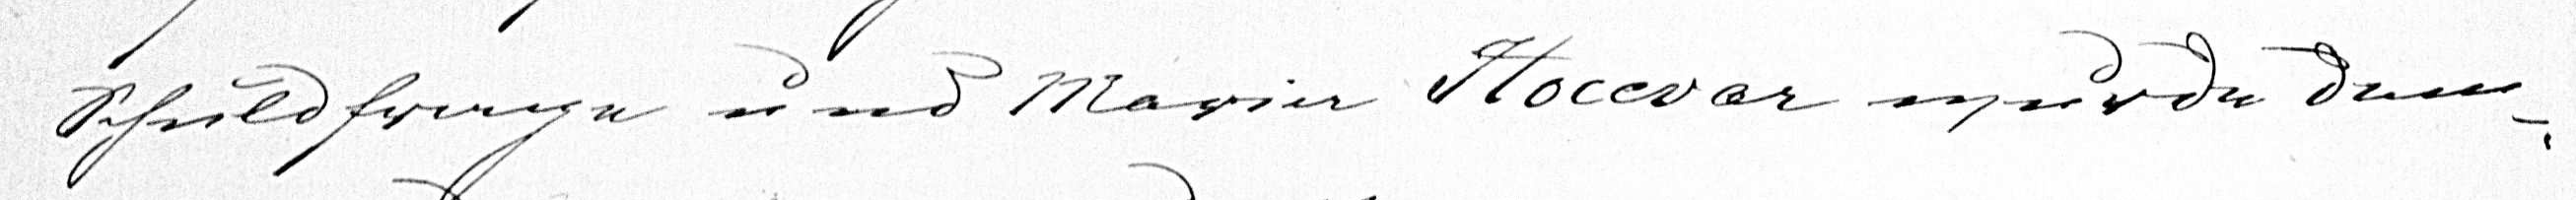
Schuldfrage und Maria Hocevar wurde dem¬
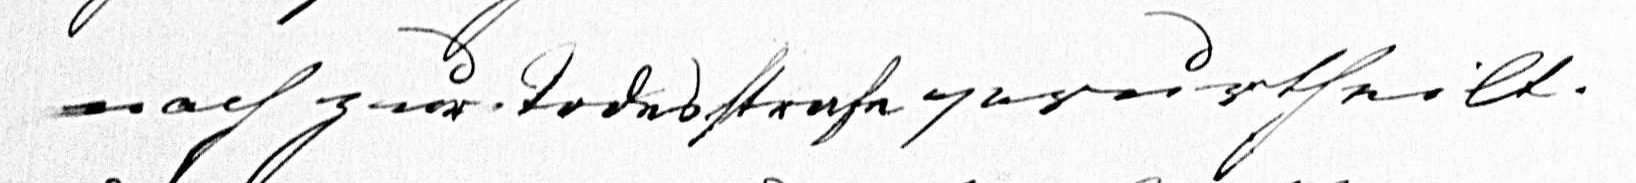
nach zur Todesstrafe verurtheilt.
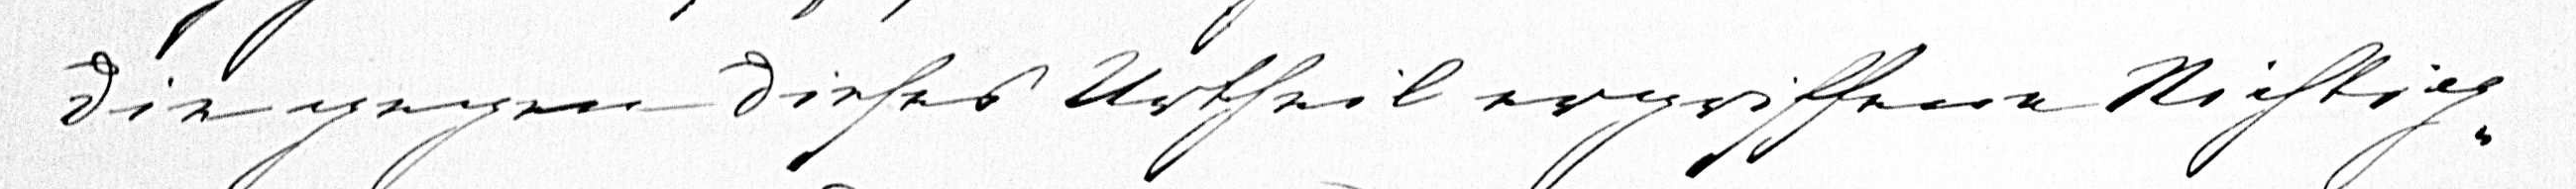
Die gegen dieses Urtheil ergriffene Nichtig¬
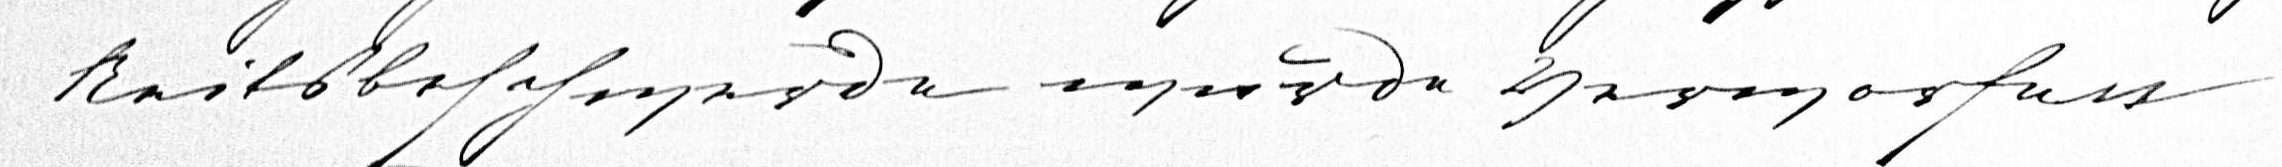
keitsbeschwerde wurde Verworfen.
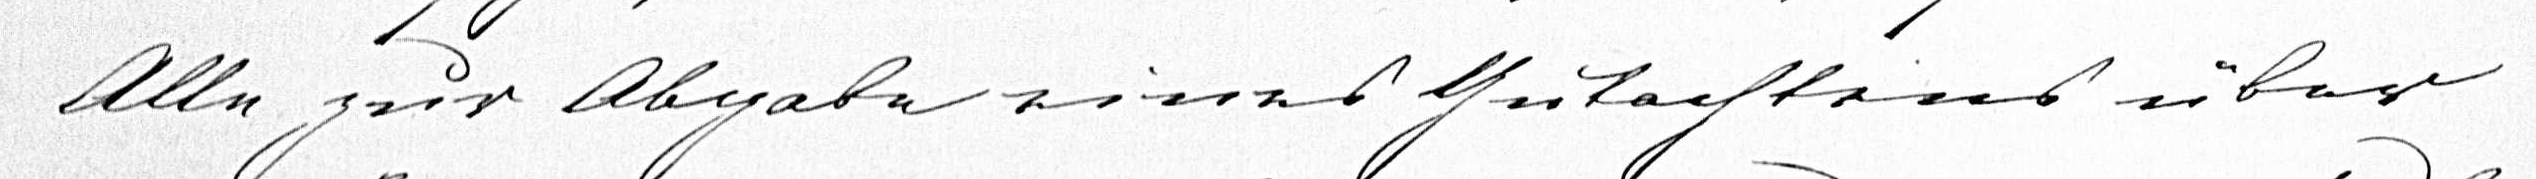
Alle zur Abgabe eines Gutachtens über
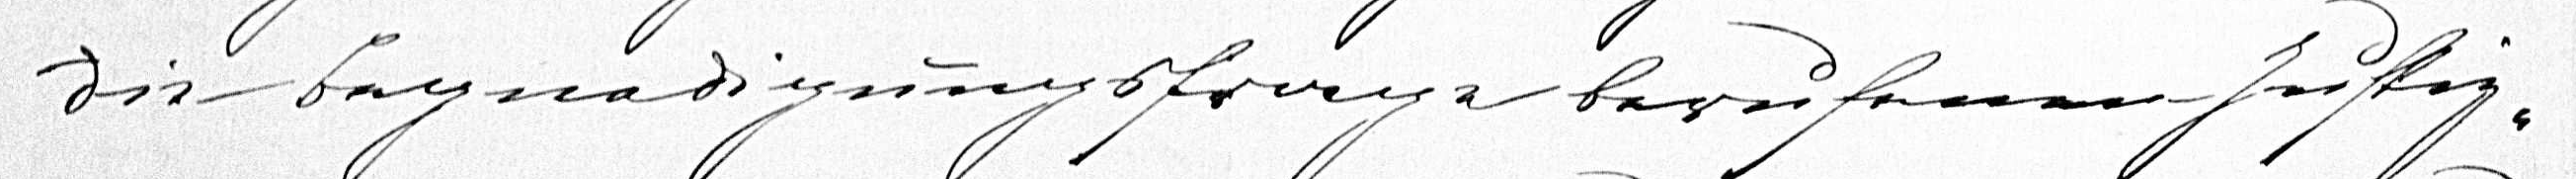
die Begnadigungsfrage berufene- Justiz¬
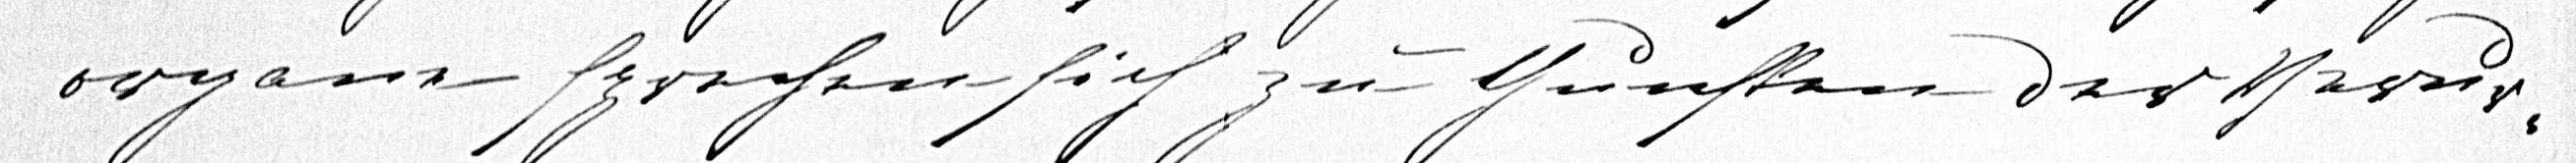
organe sprachen sich zu Gunsten der Verur¬
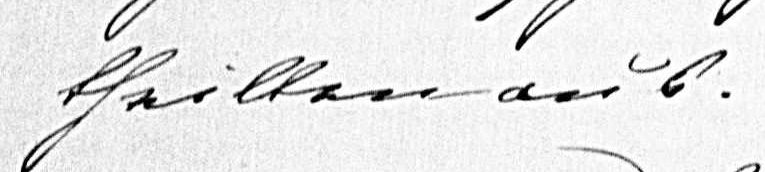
theilten aus.
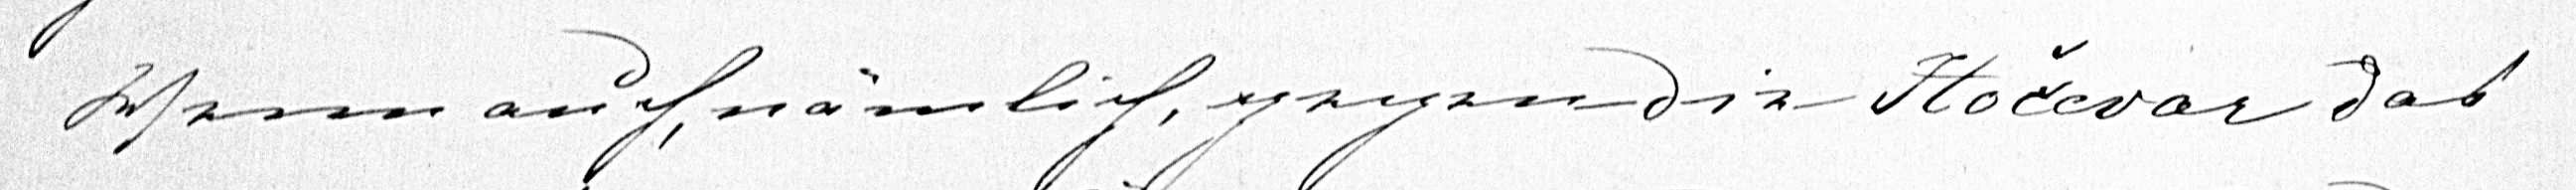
Wenn auch, nämlich, gegen die Hočevar das
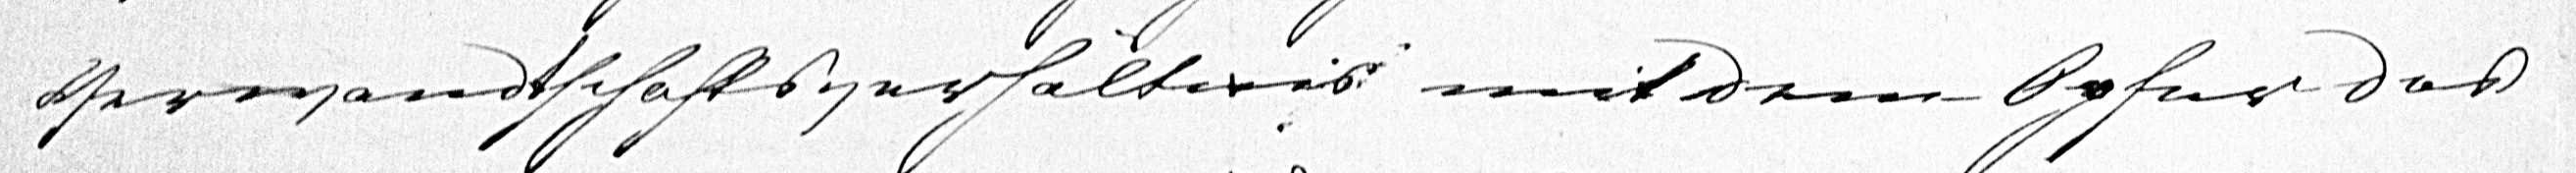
Verwandtschaftsverhältnis mit dem Opfer des
